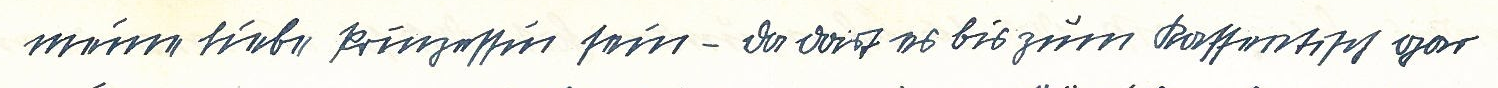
meine liebe Prinzessin sein – da darf es bis zum Kaffeetisch gar
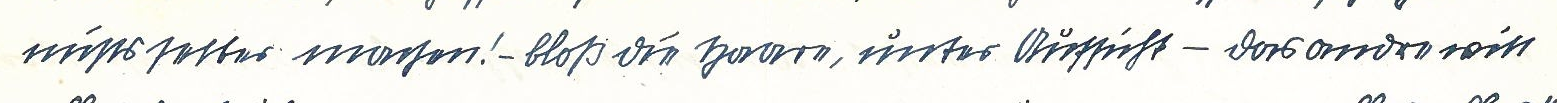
nichts selber machen! – bloß die Haare, unter Aufsicht – das andre will
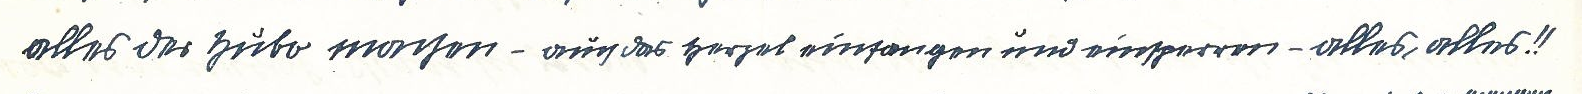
alles der Hubo machen – auch das Herzel einfangen und einsperren – alles, alles!!
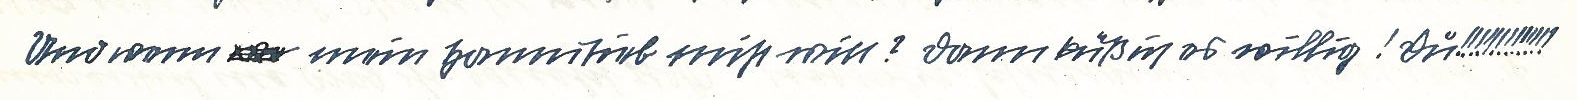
Und wenn we mein lieb nicht will? Dann küß ich es willig! Du!!!!!!!!!!!!!
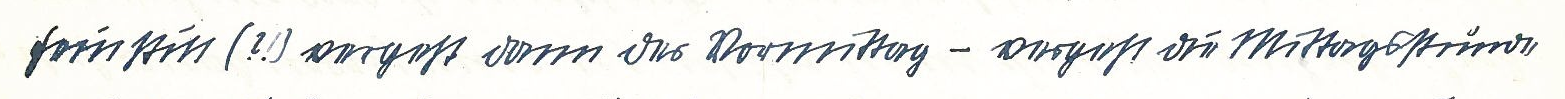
Fein still (?!) vergeht dann der Vormittag – vergeht die Mittagsstunde
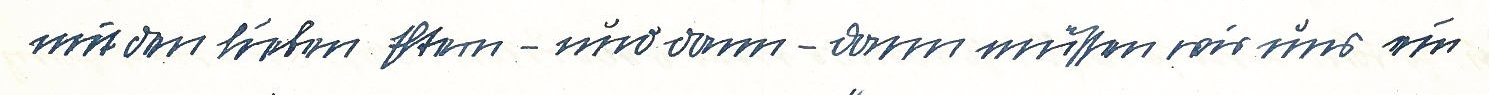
mit den lieben Eltern – und dann – dann müssen wir uns ein
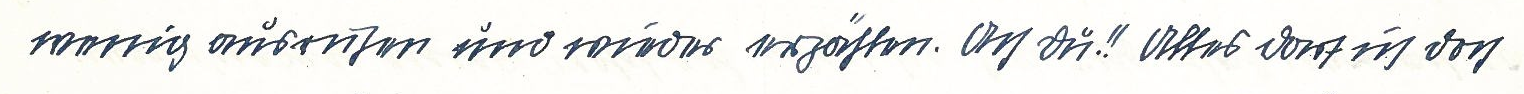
wenig ausruhen und wieder erzählen. Ach Du!! Alles darf ich doch
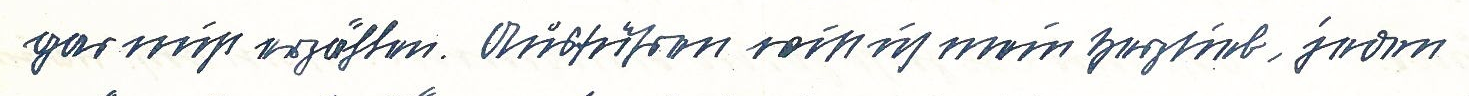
gar nicht erzählen. Ausführen will ich mein Herzlieb, jeden
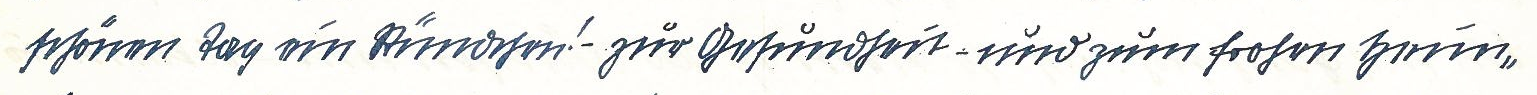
schönen Tag ein Stündchen! zur Gesundheit – und zum frohen Heim¬
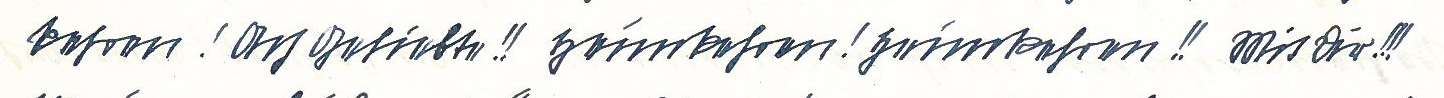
kehren! Ach Geliebte!! Heimkehren! Heimkehren!! Mit Dir!!!
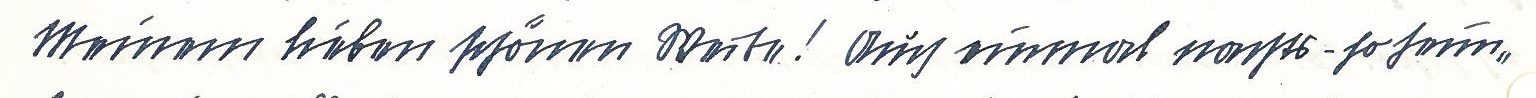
Meinem lieben schönen Weibe! Auch einmal nachts – so heim¬
